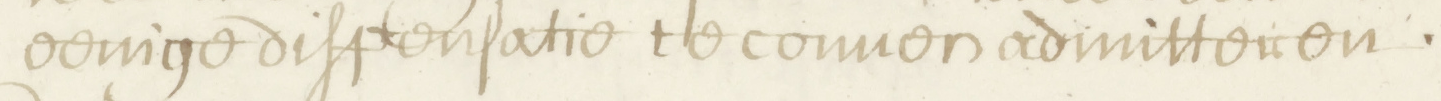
eenige dispensatie te connen admitteren.
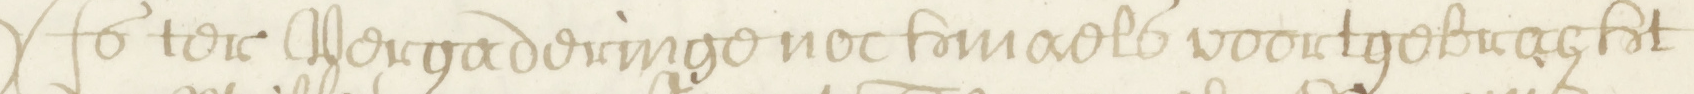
Is ter Vergaderinge nochmaels voortgebracht
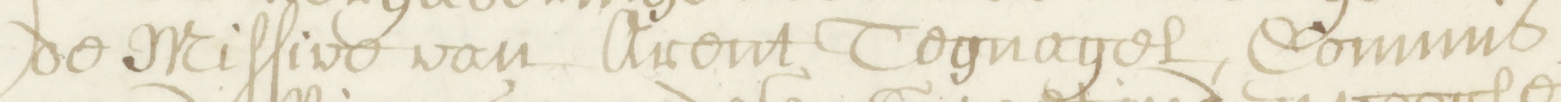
de Missive van Arent Tegnagel, Commis
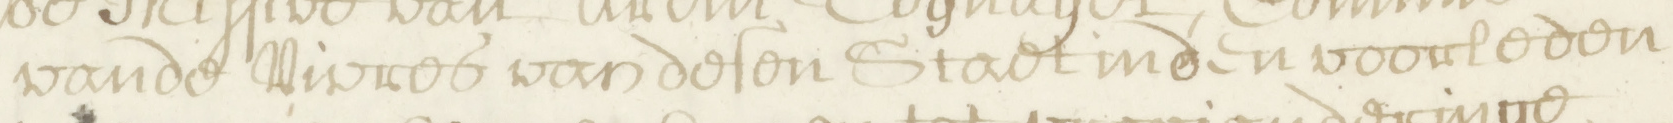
vande Vivres van desen Staet inden voorleden
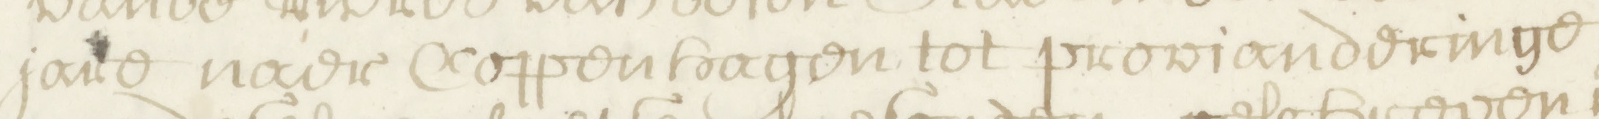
jare naer Coppenhagen tot provianderinge
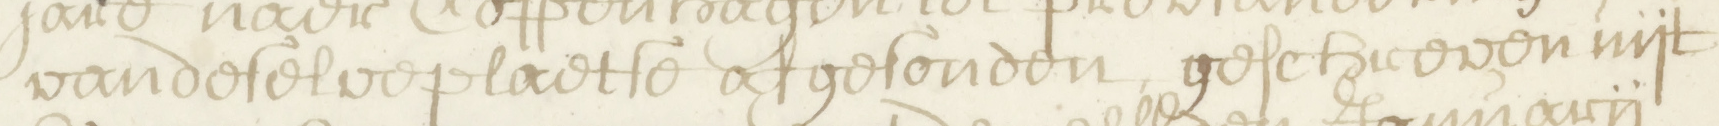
van deselve plaetse afgesonden, geschreven uijt
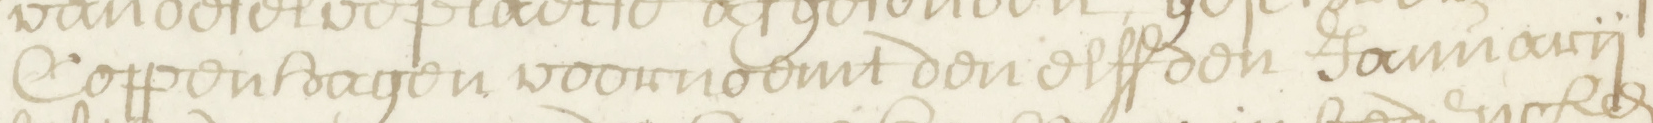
Coppenhagen voornoemt den elffden Januarij
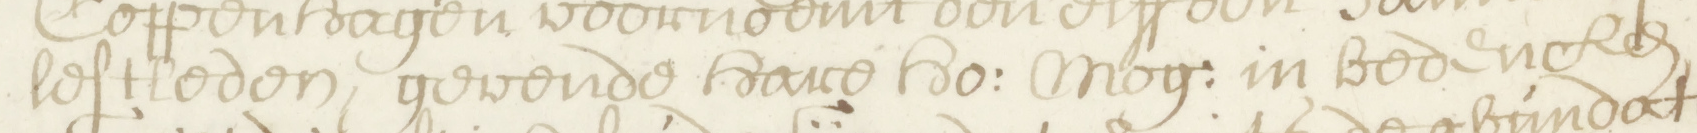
lestleden, gevende hare ho:Mog: in bedencken
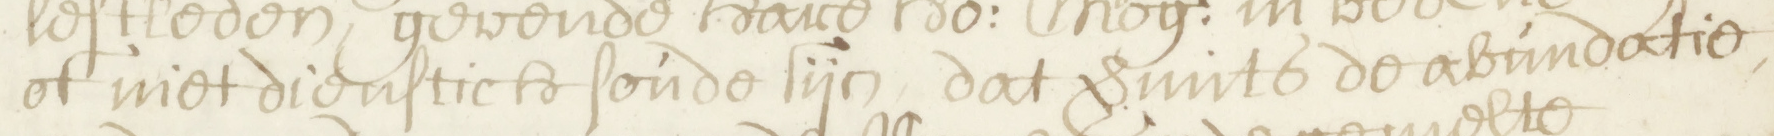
of niet dienstich soude sijn, dat vmits de abundatie,
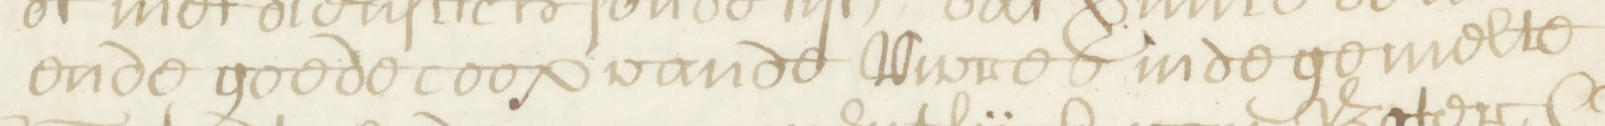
ende goede coop vande Vivres in de gemelte
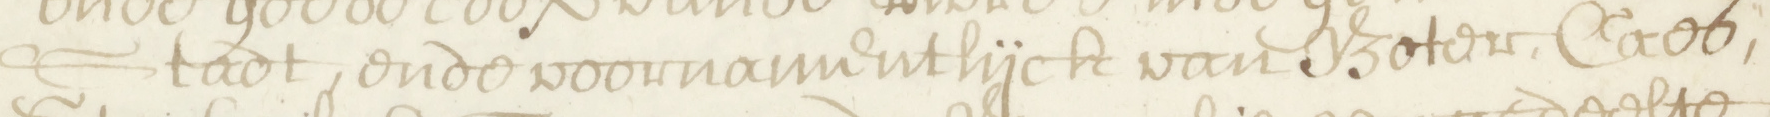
Stadt, ende voornamentlijck van Boter, Caes,
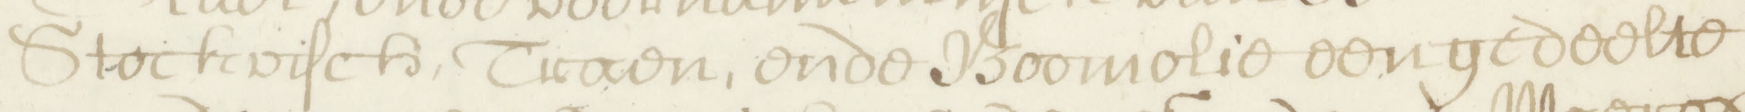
Stockvisch, Traen, ende Boomolie een gedeelte
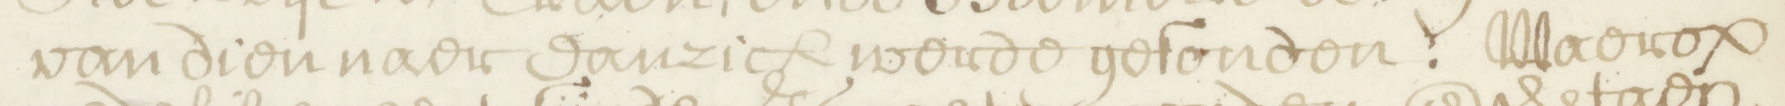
van dien naer Danzick werde gesonden: Waerop
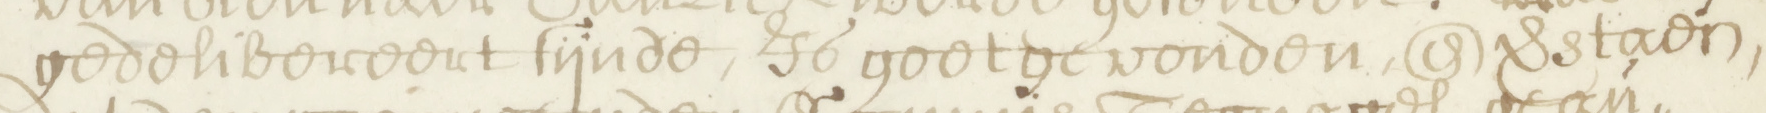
gedelibereert sijnde, Is goetgevonden, & vstaen,
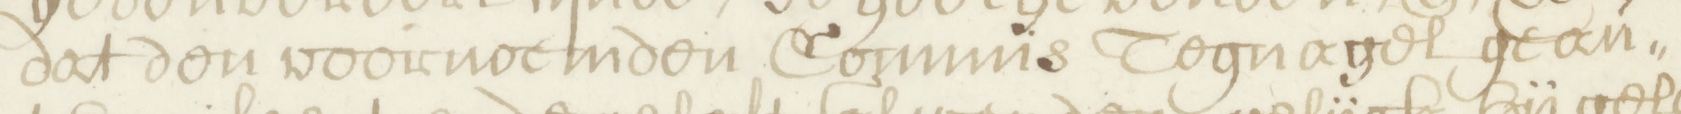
dat den voornoemden Commis Tegnagel geau,,
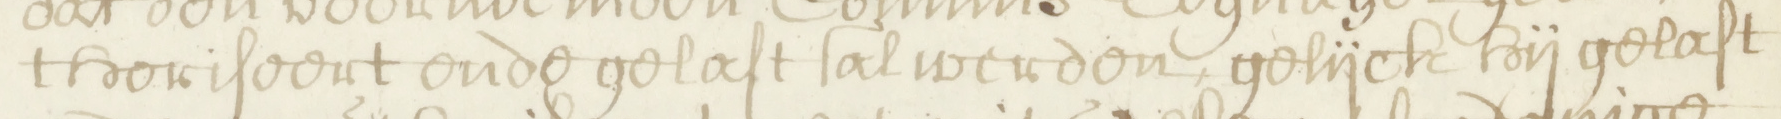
thoriseert ende gelast sal werden, gelijck hij gelast
